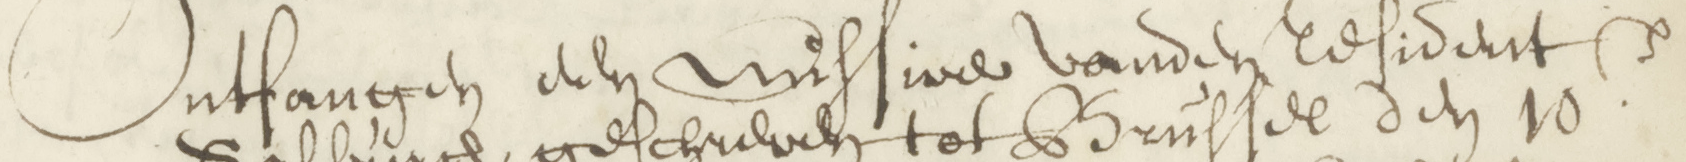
Ontfangen een Missive vanden resident
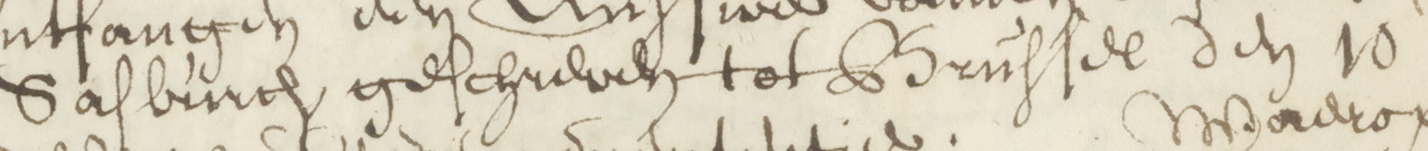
Sasburch, geschreven tot Brussel den 10e.
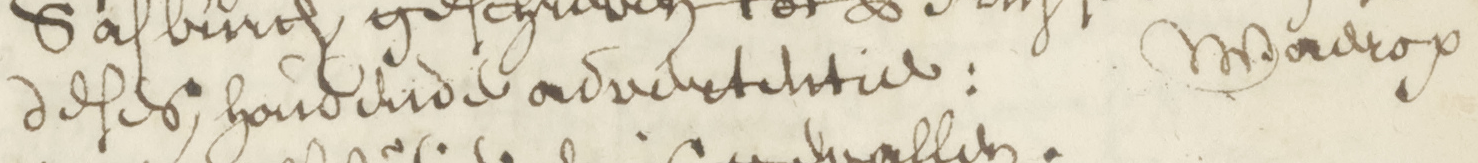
deses, houdende advertentie: Waerop
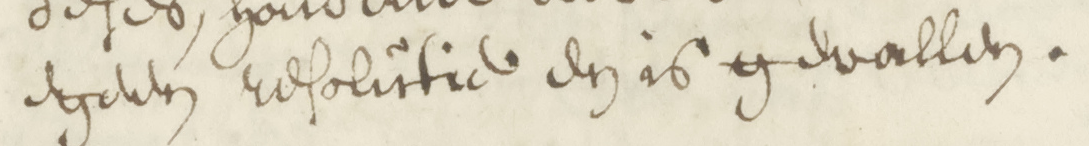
egeen resolutie en is gevallen.
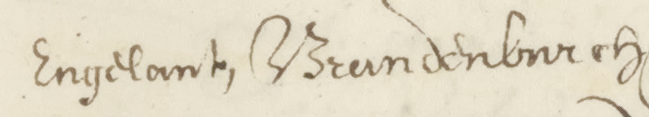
Engelant, Brandenburch
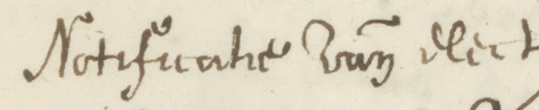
Notificatie van electie
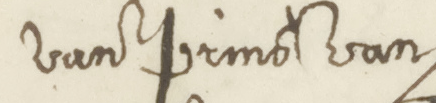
van Prins van Oraignen
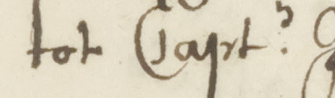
tot Captn. Genrl.
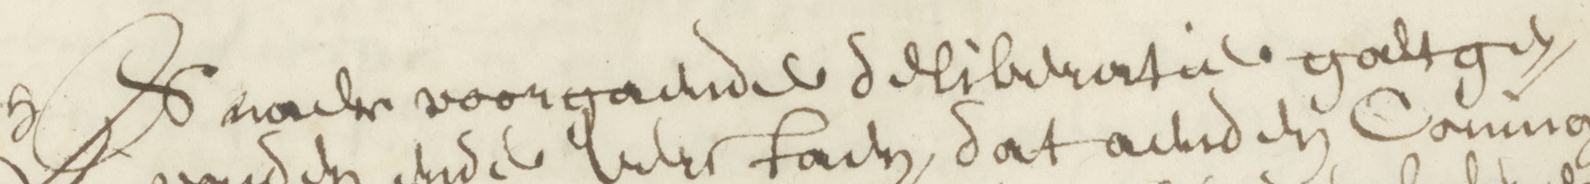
Is naer voorgaende deliberatie goetge,,
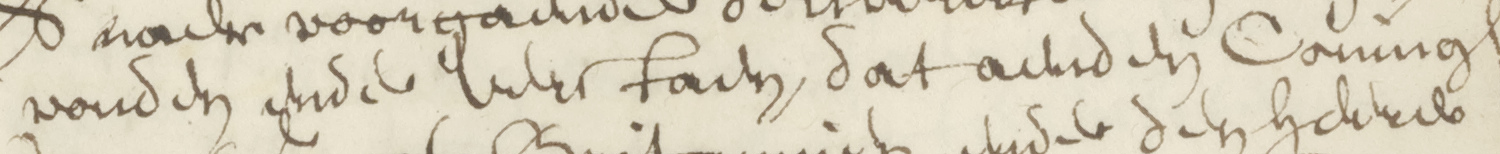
vonden ende verstaen, dat aenden Coningh
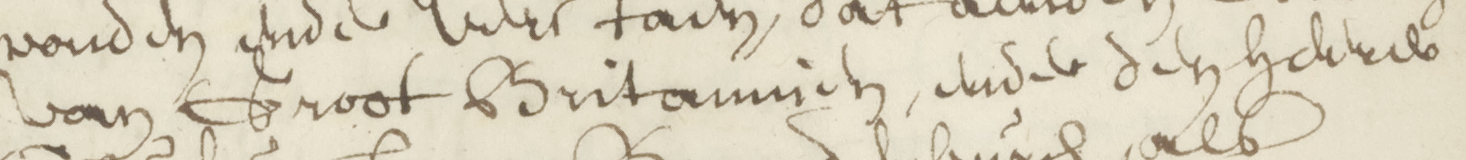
van Groot Britannien, ende den heere
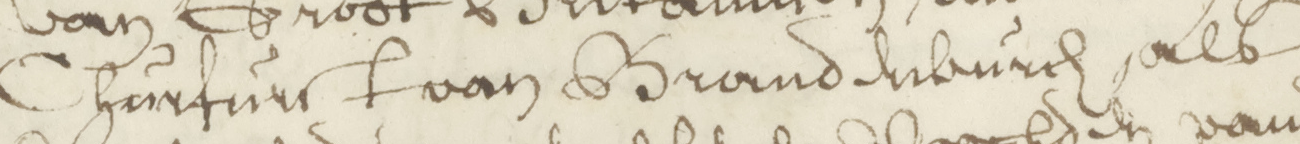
Churfurst van Brandenburch als
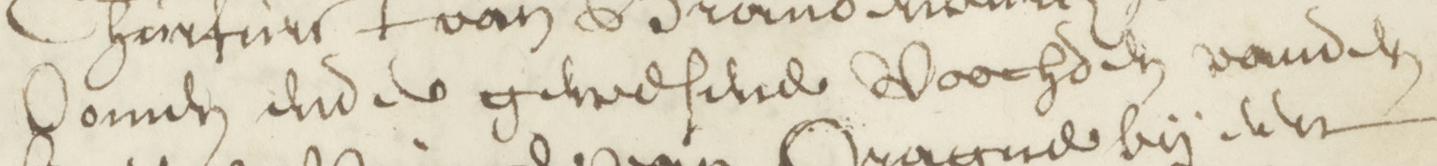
Oomen ende gewesene Voochden vanden
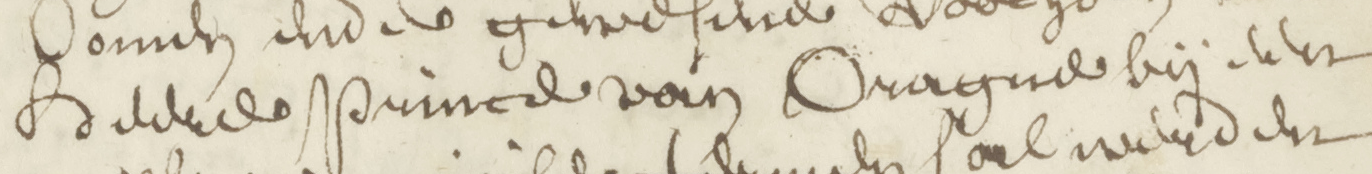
Heere Prince van Oragne bij een
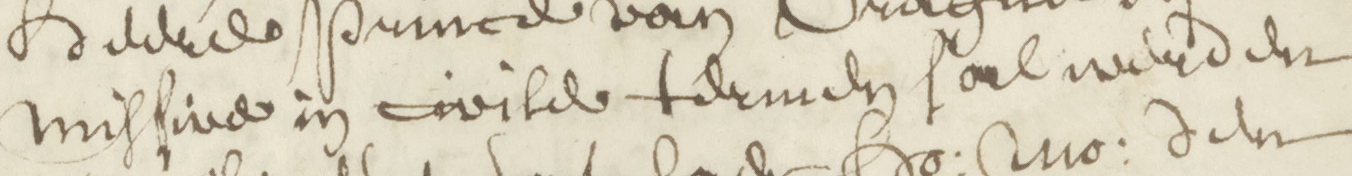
missive in civile termen sal werden
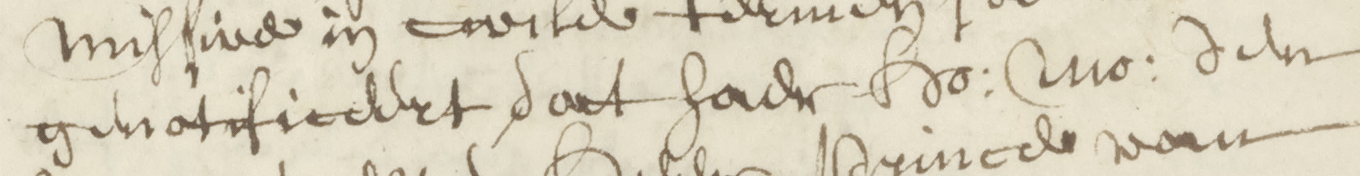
genotificeert, dat haer Ho:Mo: den
